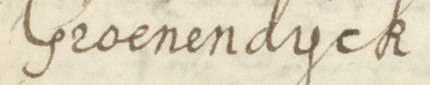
Groenendijck
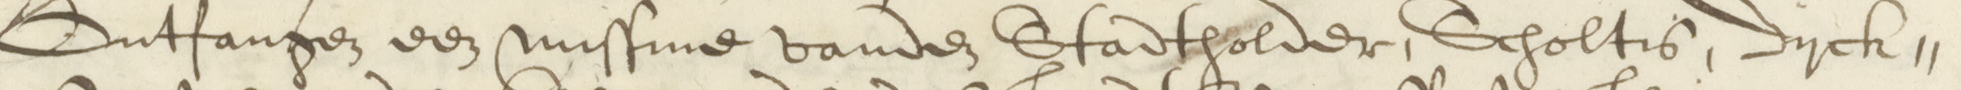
Ontfangen een missive vanden Stadtholder, Scholtis, Dijck„
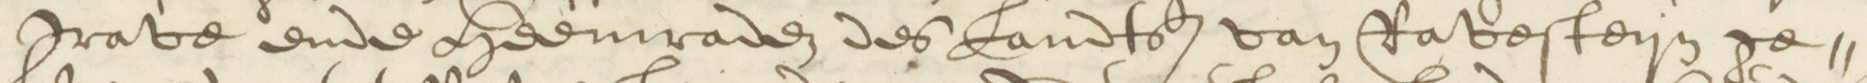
grave ende heemraden des Landts van Ravesteijn ge„
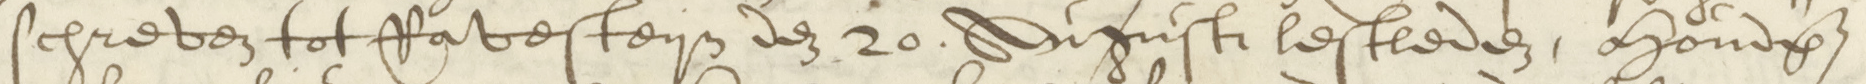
schreven tot Ravesteijn den 20. Augusti lestleden, houden
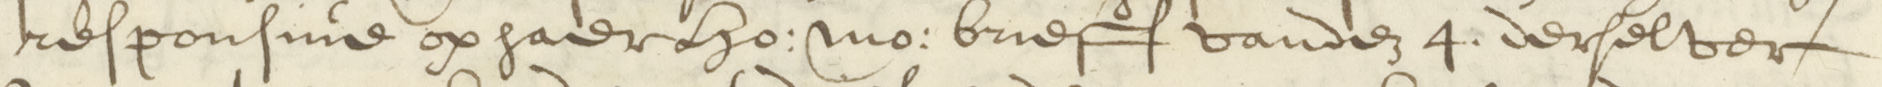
responsive op haer Ho:Mo: brieff vanden 4. derselver
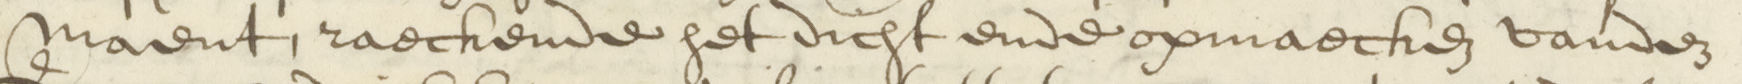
maent, raeckende het dicht ende opmaecken vanden —
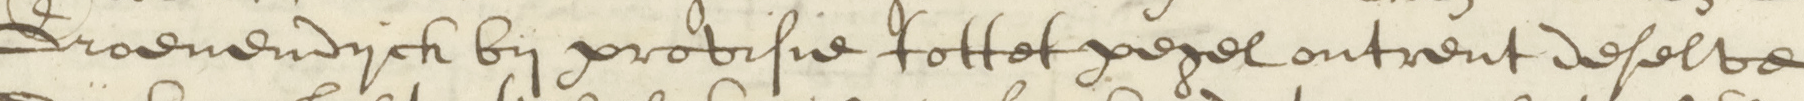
Groenendijck bij provisie tottet pegel ontrent deselve
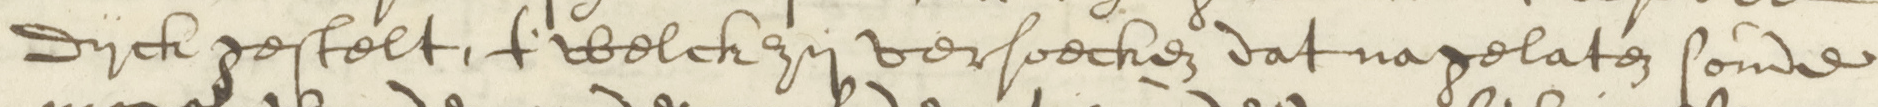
dijck gestelt, t'welck zij versoecken dat nagelaten soude
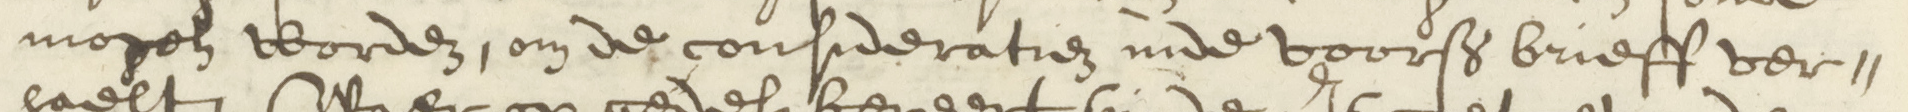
mogen worden, om de consideratien inde voorsz brieff ver„
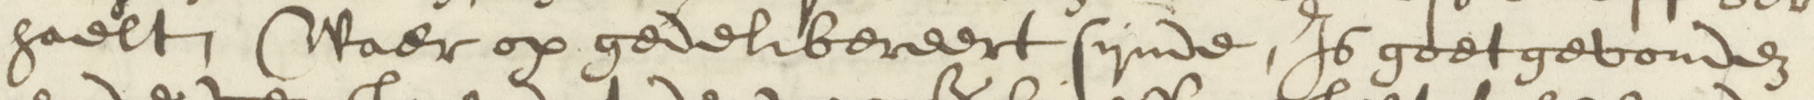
haelt, Waer op gedelibereert sijnde, Is goetgevonden
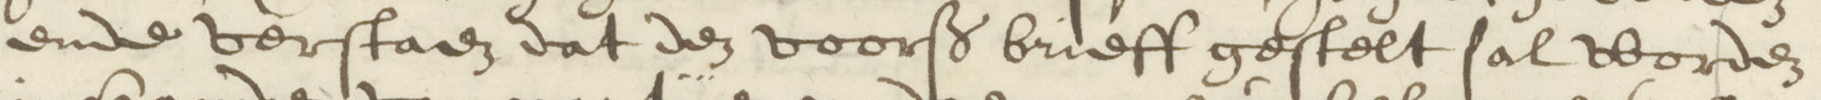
ende verstaen dat den voorsz brieff gestelt sal worden
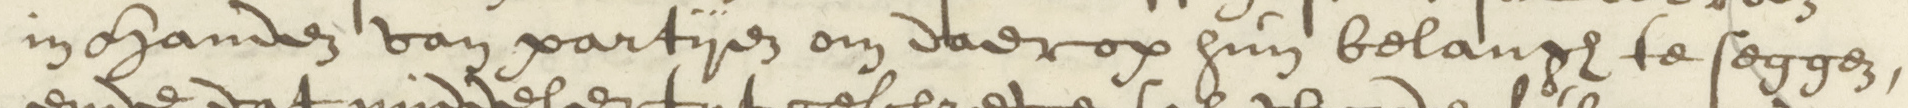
in handen van partijen om daer op hun belangen te seggen,
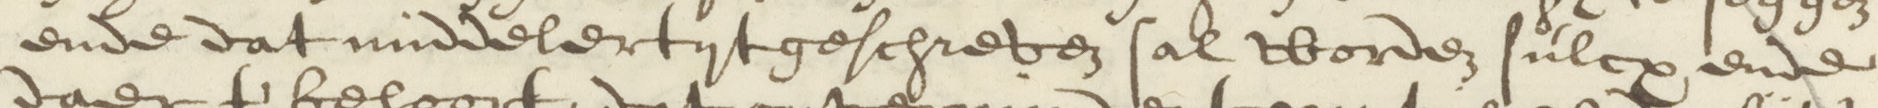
ende dat middelertijt geschreven sal worden sulcx ende
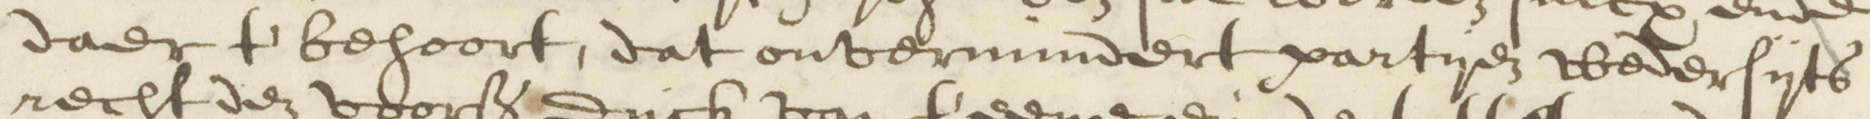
daer t'behoort, dat onvermindert partijen wedersijts
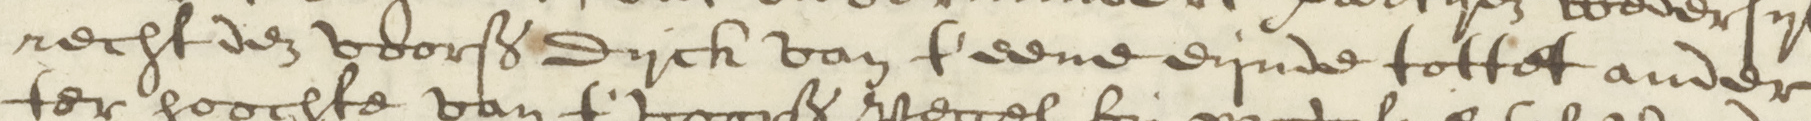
recht den voorsz Dijck van t'eene eijnde tottet ander
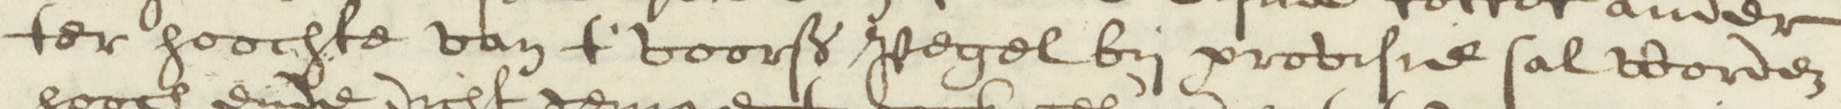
ter hoochte van t'voorsz Pegel bij provisie sal worden
